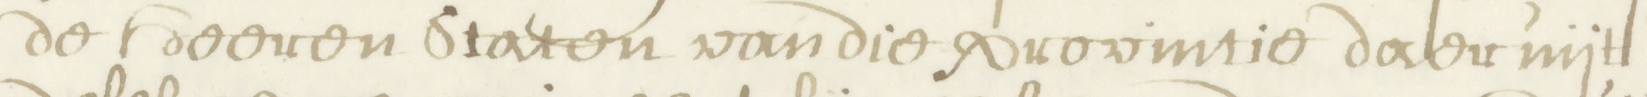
de heeren Staten van die provintie daeruijt
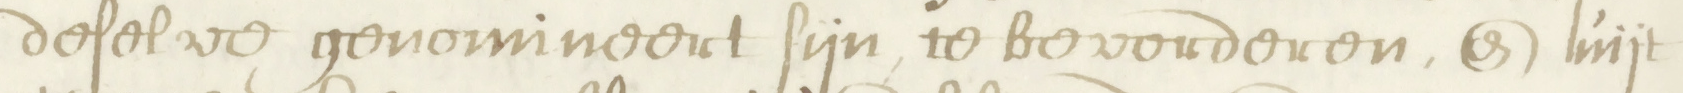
deselve genomineert sijn te bevorderen, & uijt
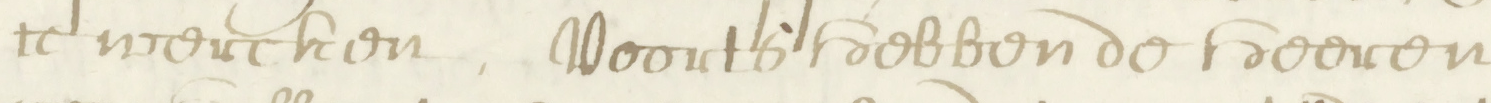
te wercken. Voorts hebben de heeren
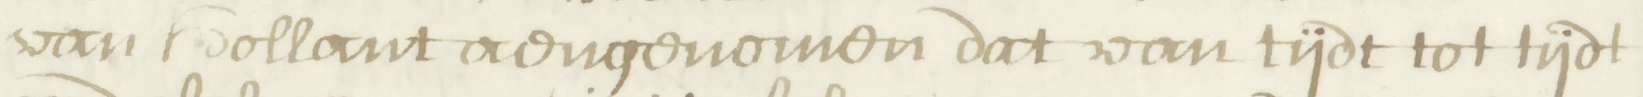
van Hollant aengenomen dat van tijdt tot tijdt
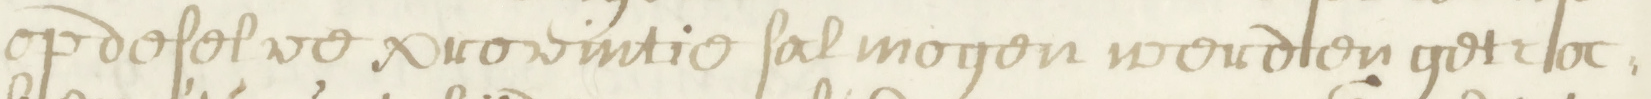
op deselve provintie sal mogen werden getroc,,
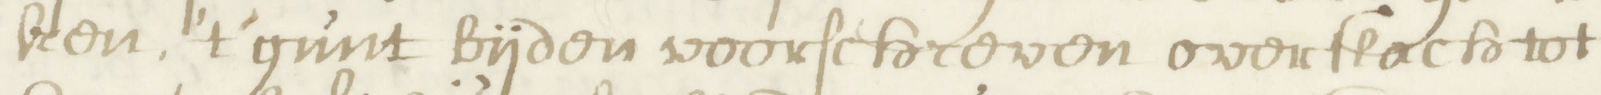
ken, 't' gunt bijden voorschreven overslach tot
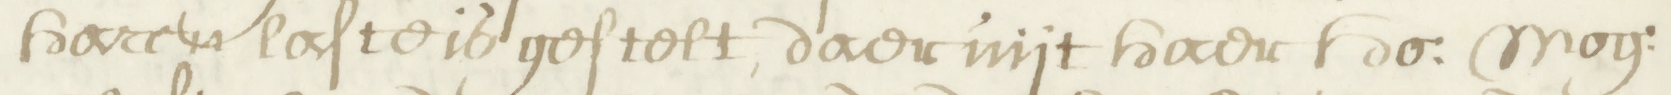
haren laste is gestelt, daeruijt haer Ho:Mog:
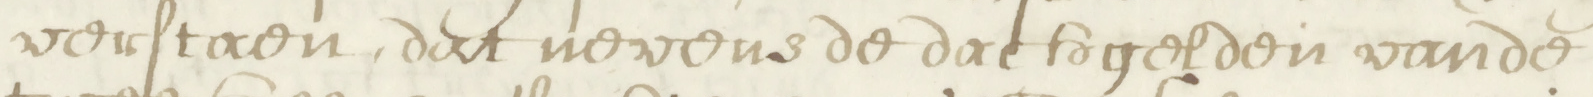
verstaen, dat nevens de dachgelden vande
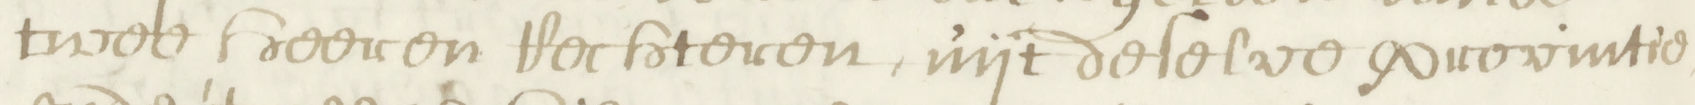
twee Heeren Rechteren, uijt deselve provintie
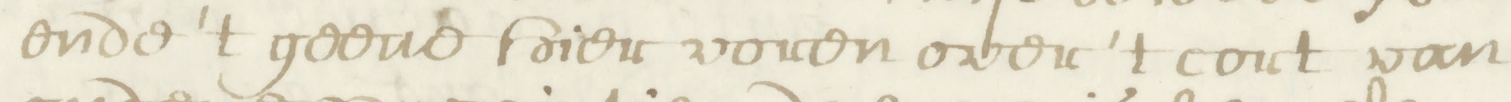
ende 't geene hier voren over 't cort van
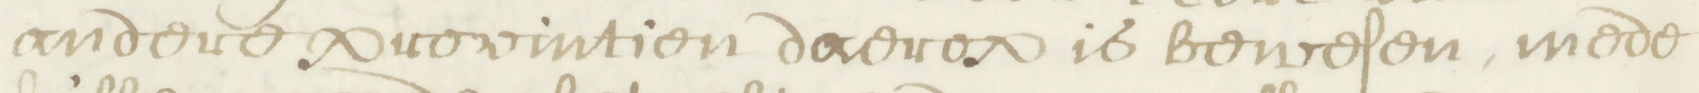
andere provintien daerop is bewesen, mede
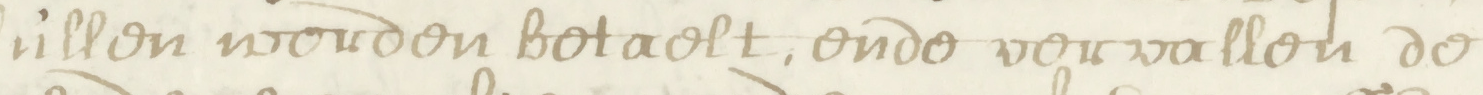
sullen worden betaelt, ende vervallen de
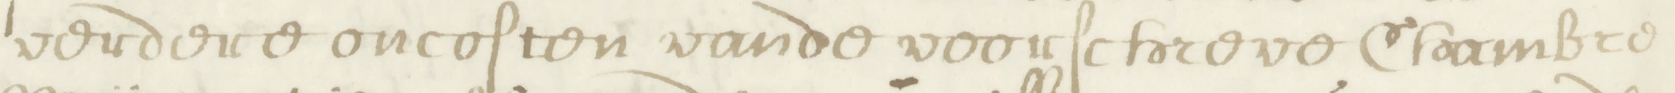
verdere oncosten vande voorschreve Chambre
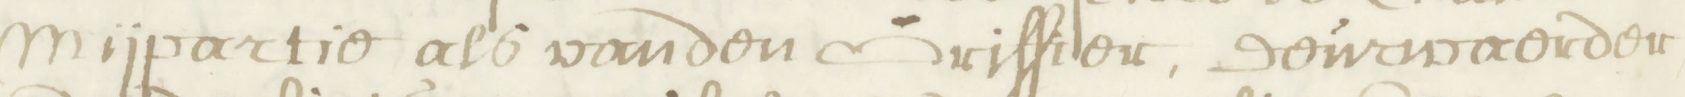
Mijpartie als vanden Griffier, Deurwaerder
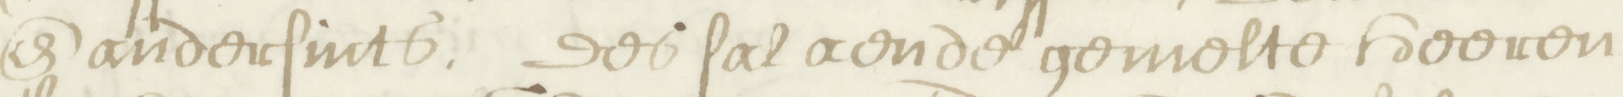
& andersints. Des sal aende gemelte heeren
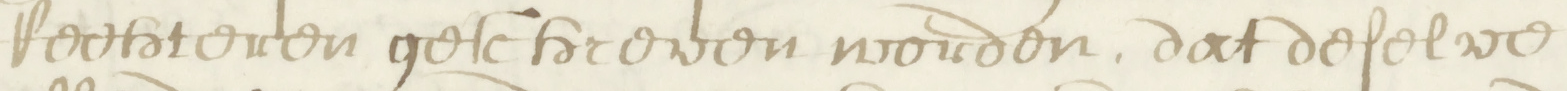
Rechteren geschreven worden, dat deselve
